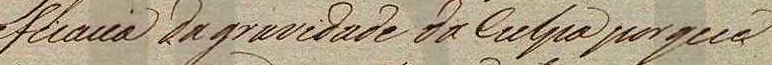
eficacia da gravidade da Culpa porque
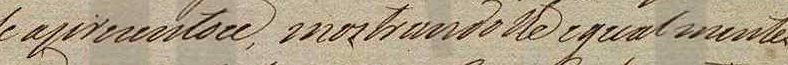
se aprezentou, mostrandolhe igualmente
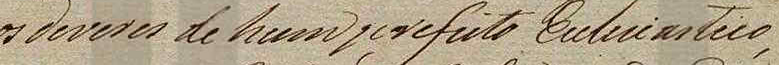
os deveres de hum prefeito Ecclesiastico,
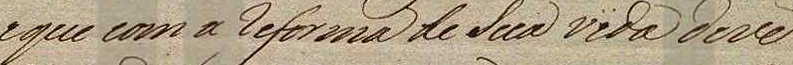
e que com a Reforma de sua vida deve
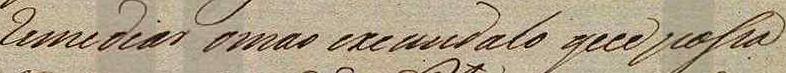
Remediar o mao execuudalo que possa
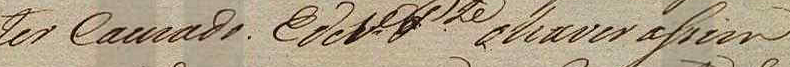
ter cauzado; E de V. P.te o haver assim
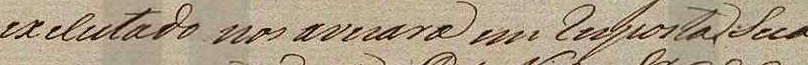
executado nos avizara em Resposta sua
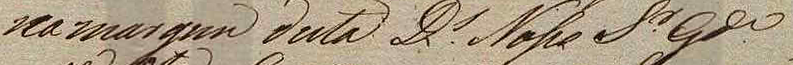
a margem desta D.s Nosso S.r G.de
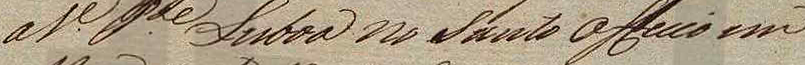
a V. P.te Lisboa no Santo officio em
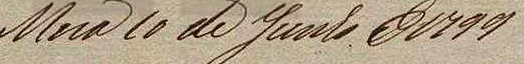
Meza 10 de Junho d̄ 1799
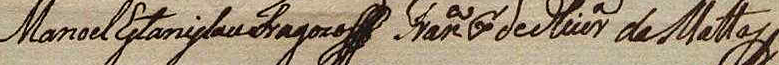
Manoel Estanislau Fragozo Fran.co X.r de Oliv.a da Matta
